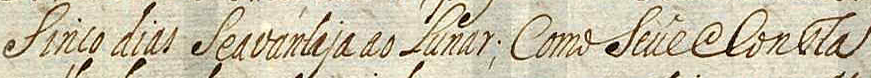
sinco dias Se avanteja ao Lunar; Como Se uê e Consta
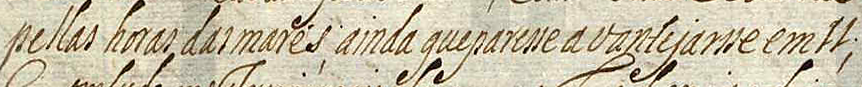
pellas horas das mares, ainda que paresse avantejarse em 11;
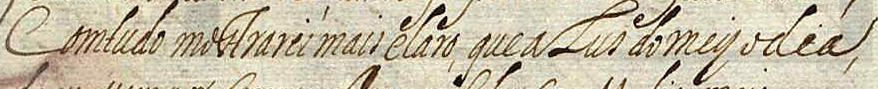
Comtudo mostrarei mais claro, que a Lus do meyo dia,
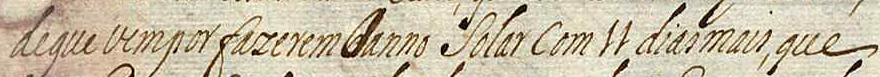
de que vem por fazerem O anno solar com 11 dias mais, que
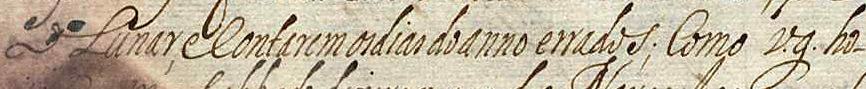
o Lunar, e Contarem os dias do anno errados. Com o v.g. ho
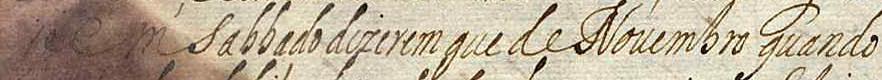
je em sabbado dizerem, que de Nouembro quando
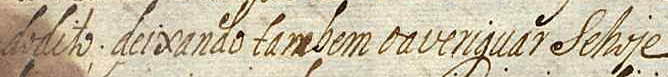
do dito. deixando tambem o averiguar Se hoje
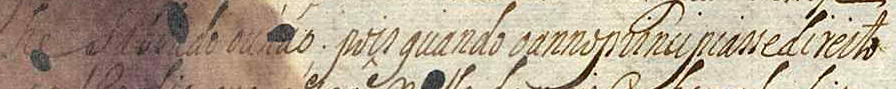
he Sabado ou não; pois quando o anno pricipiasse direito
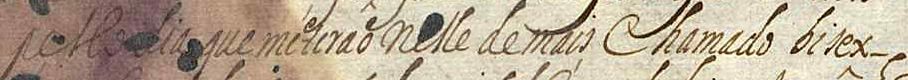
pello dia que meteraõ nelle de mais chamado bisex
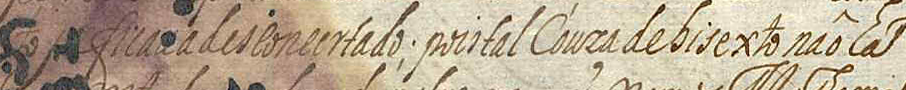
to _ ficaua desconcertado; por tal Couza de bisexto naõ há
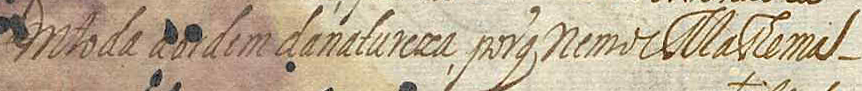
m toda a ordem da natureza porq̄ nem os Mathema
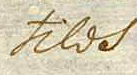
tiCos
